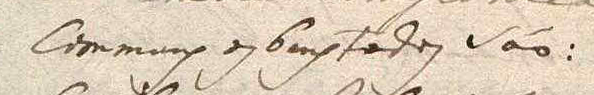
Communs os bens todos saõ:
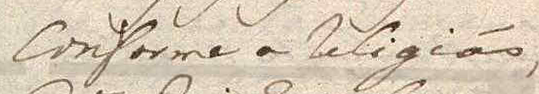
Conforme a Religiaõ,
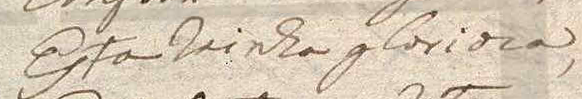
Esta Rainha glorioza,
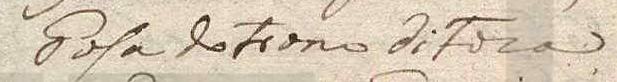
Gosa do trono ditoza
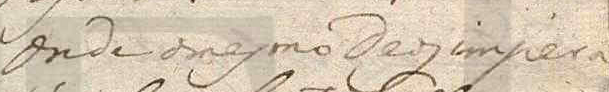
Onde o mesmo Deos impera
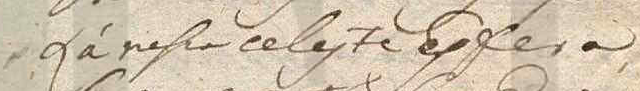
Lá nessa celeste Esfera,
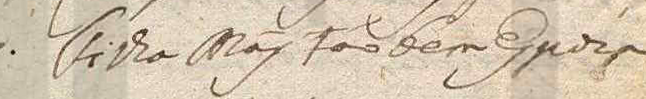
Filha Mãy taõbem Espoza.
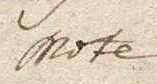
Mote
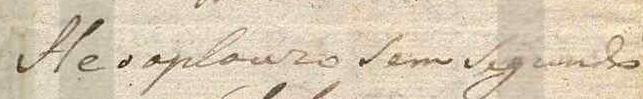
He o aplauzo sem Segundo
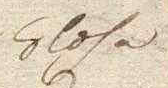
Glosa
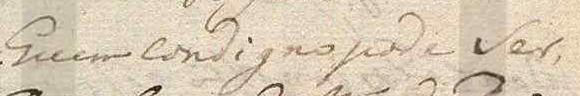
Quem condigno pode Ser,
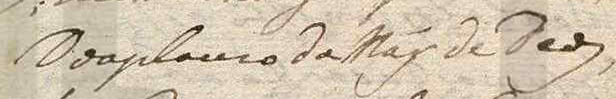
Do aplauzo da Mãy de Deos,
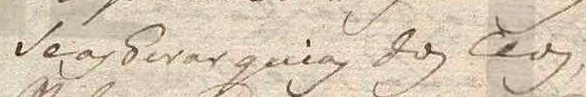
Se as herarguias dos Ceos,
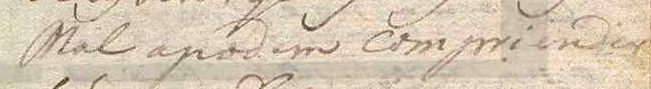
Mal a podem compriender
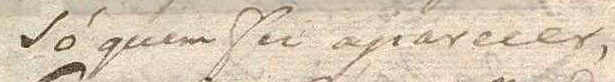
Só quem fez aparecer,
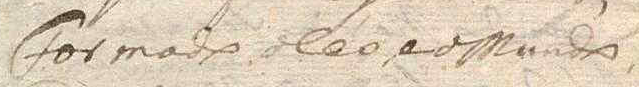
Formado o Ceo, e o Mundo,
